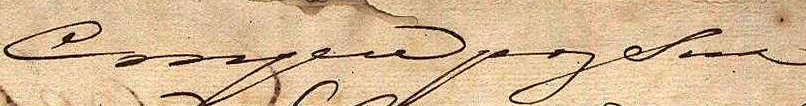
Em que pos Sua
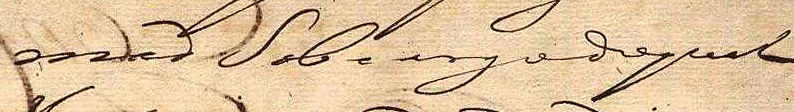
maõ Sob cargo do qual
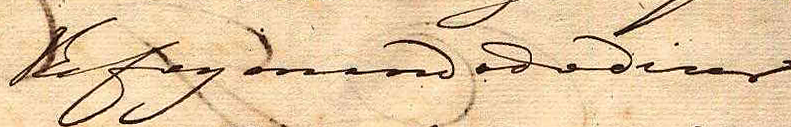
lhe foy mandado dizer
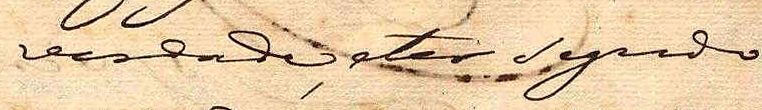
verdade e ter segredo
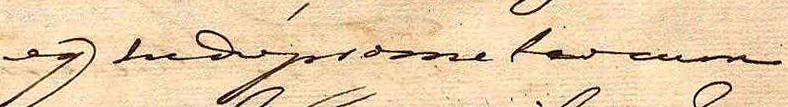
o q̄ tudo prometeo cum
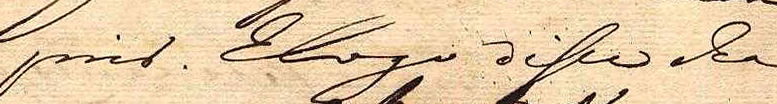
prir E logo disse cha
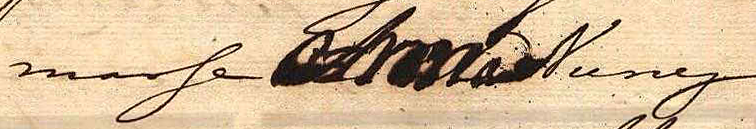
marse Anna Nunes
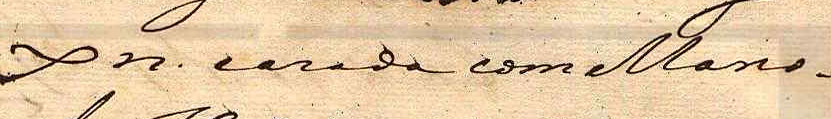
x n. cazada com Mano
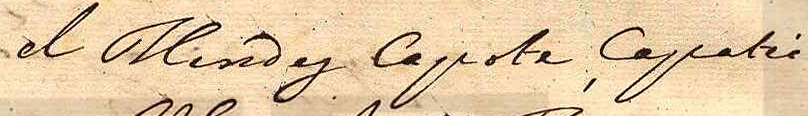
el Mendes Capote Çapatei
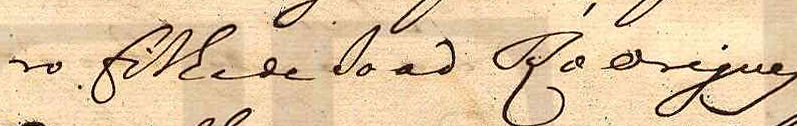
ro. filha de Ioaõ Rodrigues
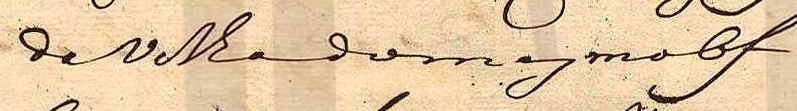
da Velha do mesmo Of
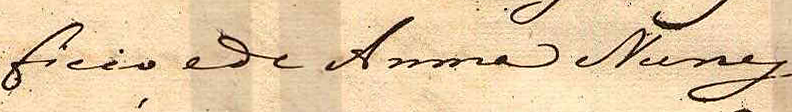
ficio e de Anna Nunes
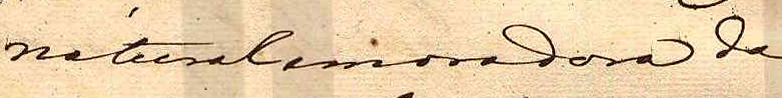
natural e moradora da
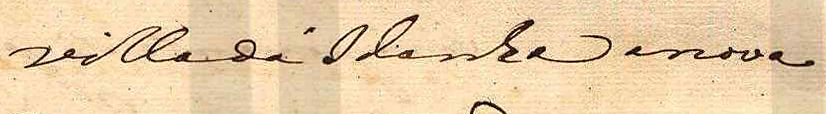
villa da Idanha a nova
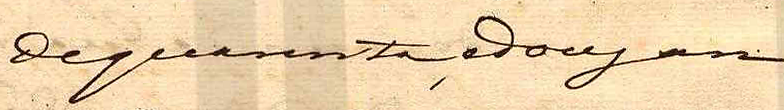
de quarenta, e dous an
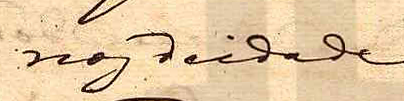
nos de idade
